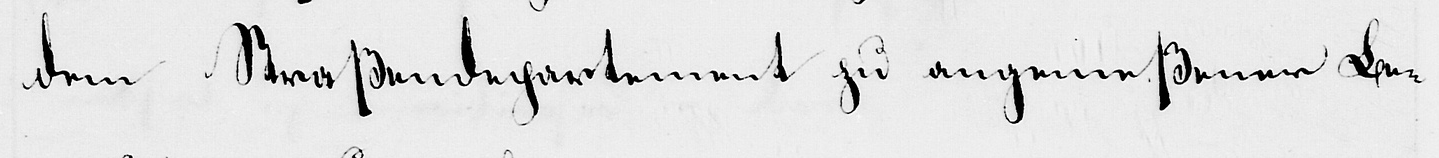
dem Strassendepartement zu angemeßener Be¬
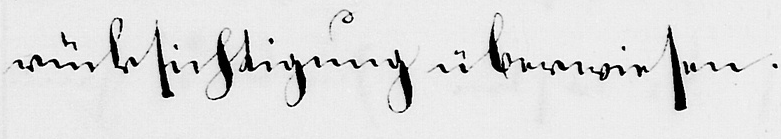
rücksichtigung überwiesen.
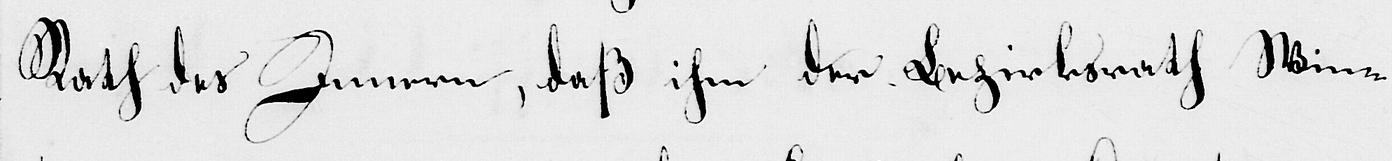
Rath des Innern, dass ihm der Bezirksrath Win¬
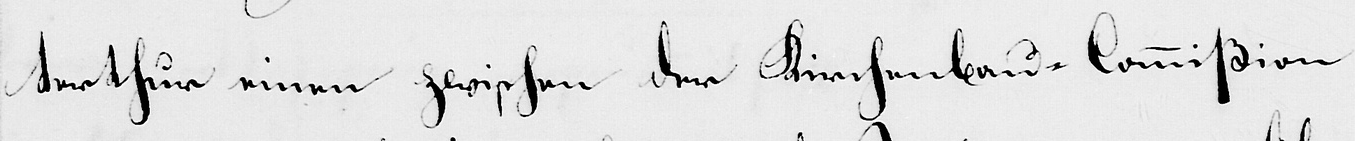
terthur einen zwischen der Kirchenbau-Commission
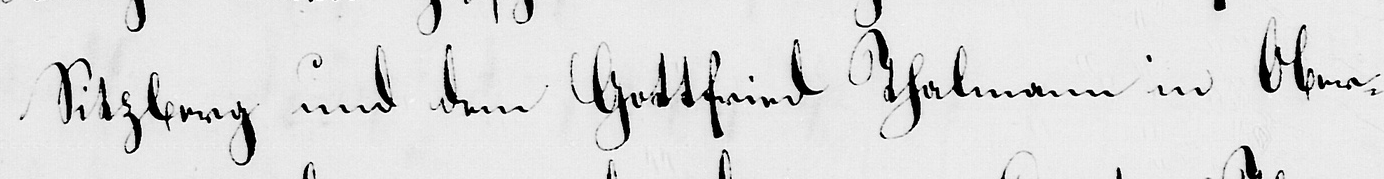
Sitzberg und dem Gottfried Thalmann in Ober¬
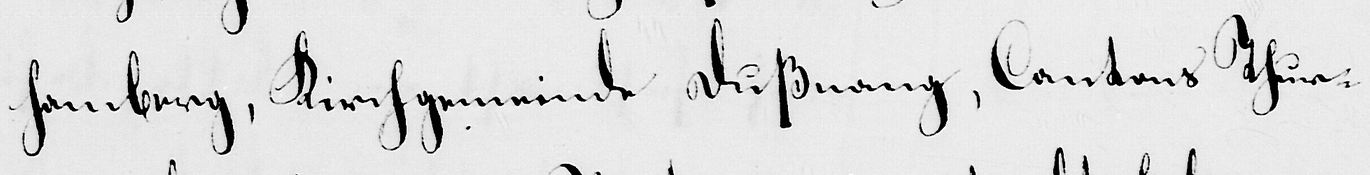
hamberg, Kirchgemeinde Dußnang, Cantons Thur¬
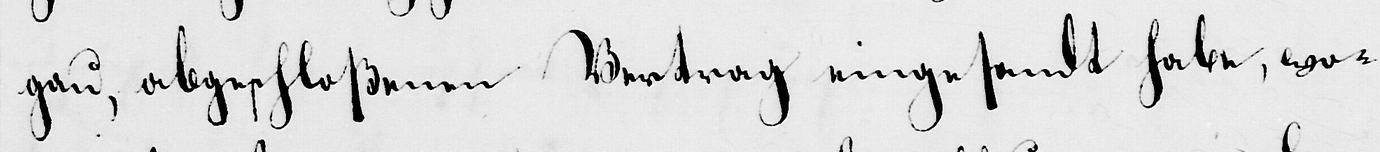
gau, abgeschloßenen Vertrag eingesandt habe, wo¬
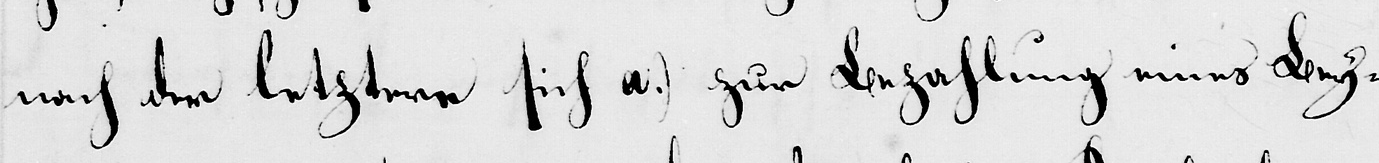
nach der letztere sich a.) zur Bezahlung eines Bey¬
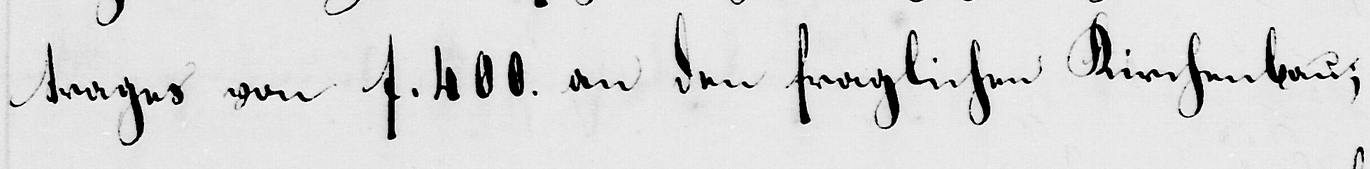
trages von f. 400. an den fraglichen Kirchenbau;
